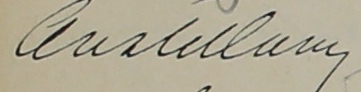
Ausstellung
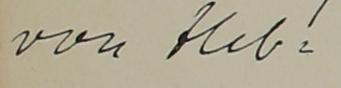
von Heb-
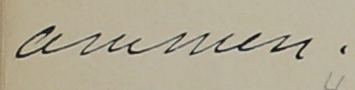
ammen
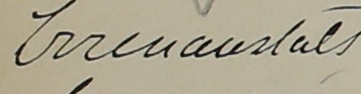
Irrenanstalt
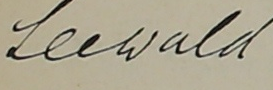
Seewald
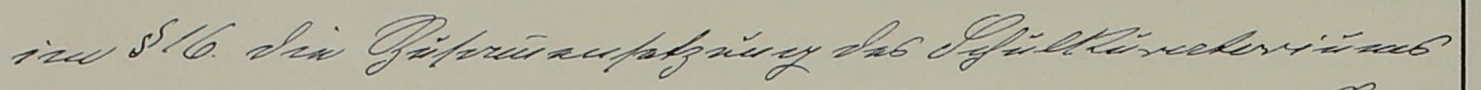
im § 16. die Zusammensetzung des Schulkuratoriums
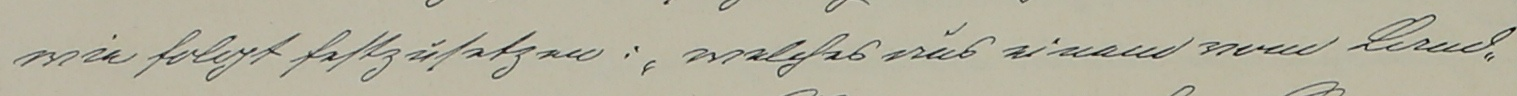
wie folgt festzusetzen: „welches aus einem vom Land-
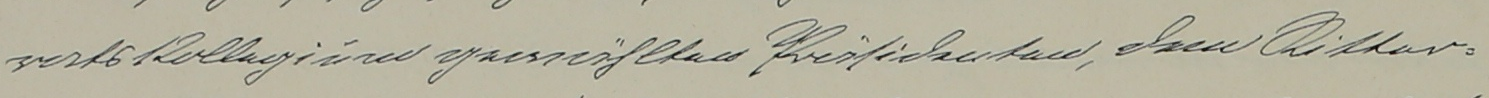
ratskollegium gewählten Präsidenten, dem Ritter-
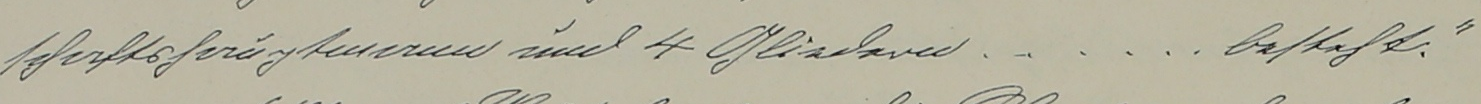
schaftshauptmann und 4 Gliedern ...... besteht.“
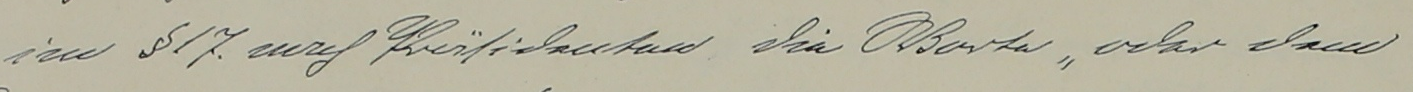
im § 17. nach Präsidenten die Worte „oder dem
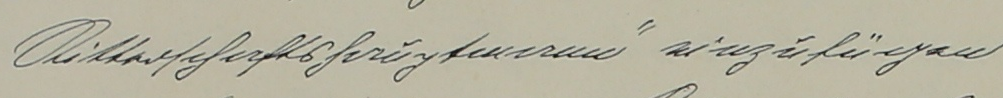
Ritterschaftshauptmann“ einzufügen
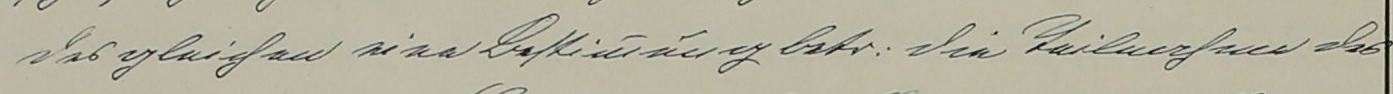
desgleichen eine Bestimmung betr. die Teilnahme des
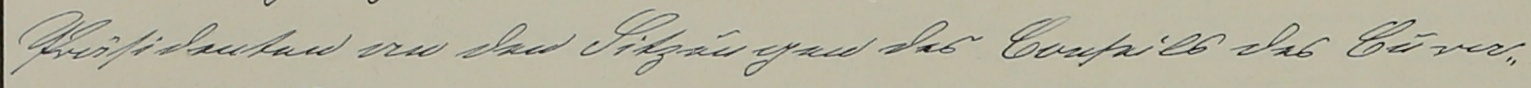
Präsidenten an den Sitzungen des Conseils des Cura-
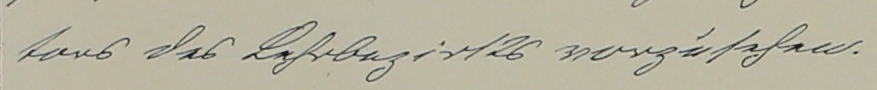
tors des Lehrbezirks vorzusehen.
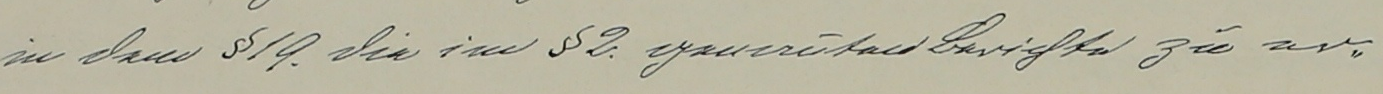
in dem § 19. die im § 2. genannten Berichte zu er-
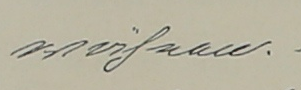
wähnen.
